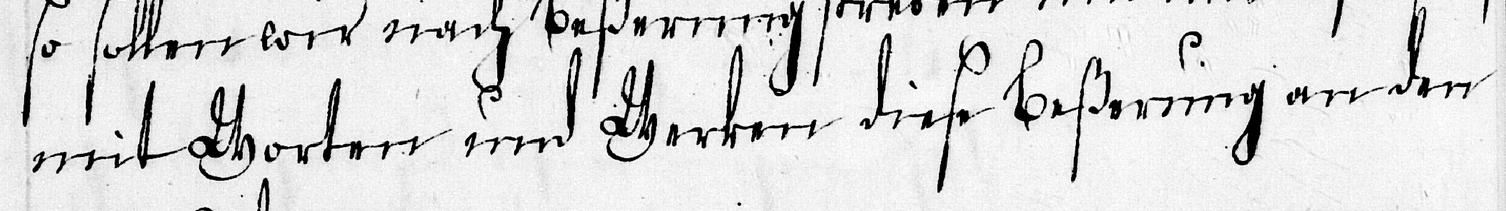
mit Worten und Werken diese Beßerung an den
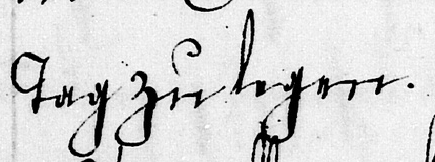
Tag zu legen.
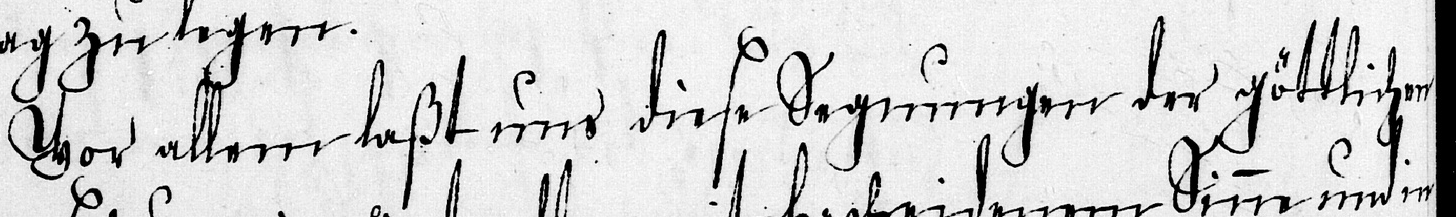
Vor allem laßt uns diese Segnungen der göttlichen
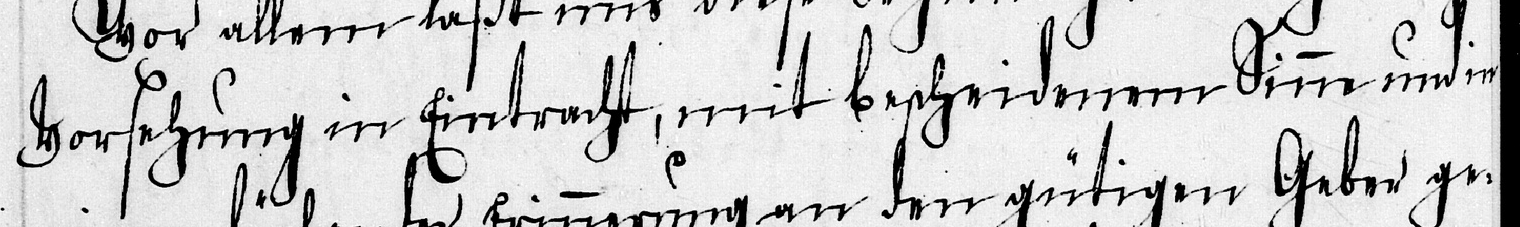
Vorsehung in Eintracht, mit bescheidenem Sinne und in
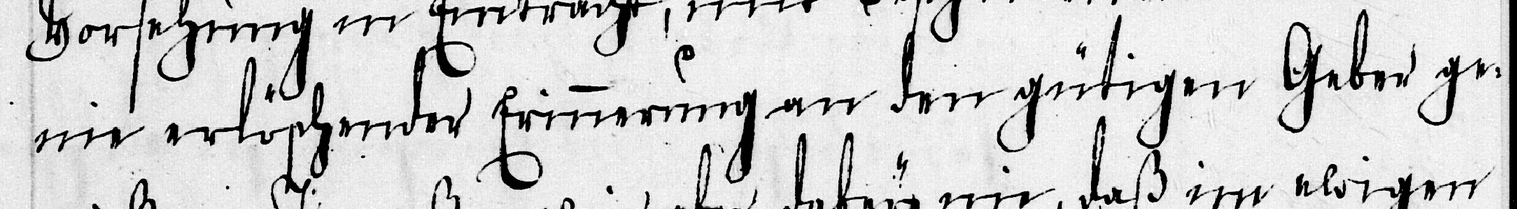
nie erlöschender Erinnerung an den gütigen Geber ge¬
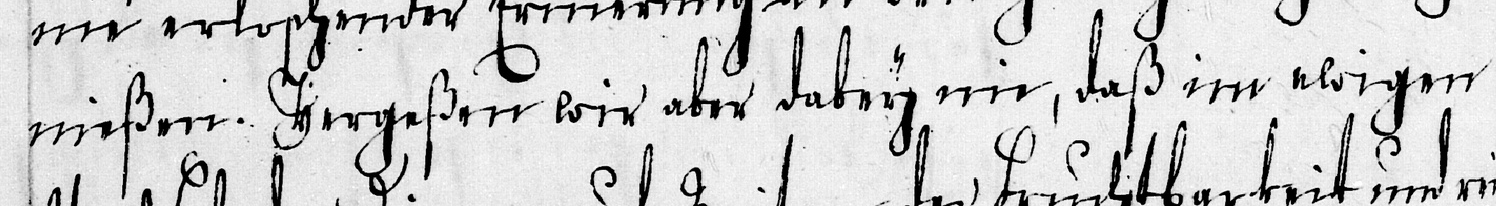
nießen. Vergeßen wir aber dabey nie, daß im ewigen
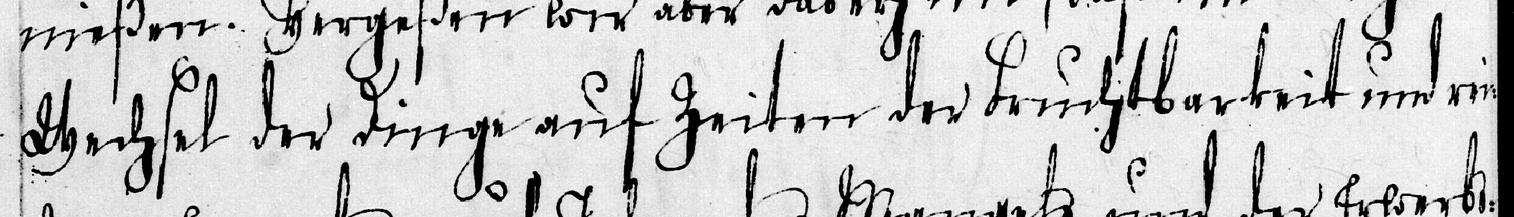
Wechsel der Dinge auf Zeiten der Fruchtbarkeit und re¬
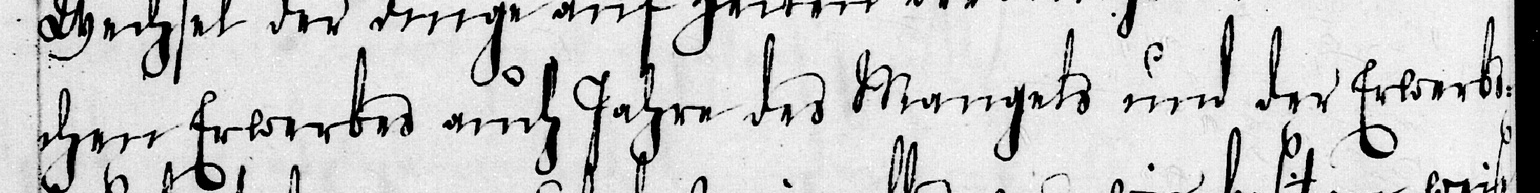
ichen Erwerbes auch Jahre des Mangels und der Erwerbs¬
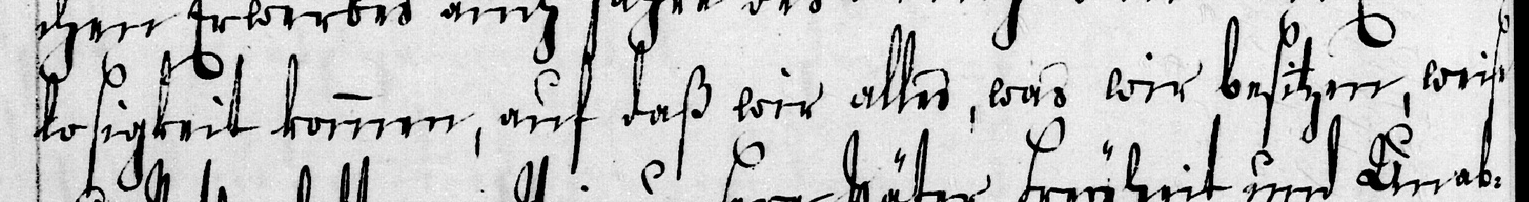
losigkeit kommen, auf daß wir alles, was wir besitzen, weise
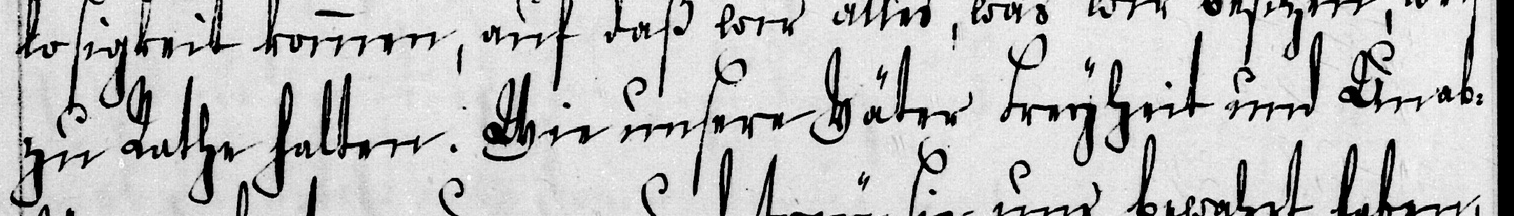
zu Rathe halten. Wie unsere Väter Freyheit und Unab¬
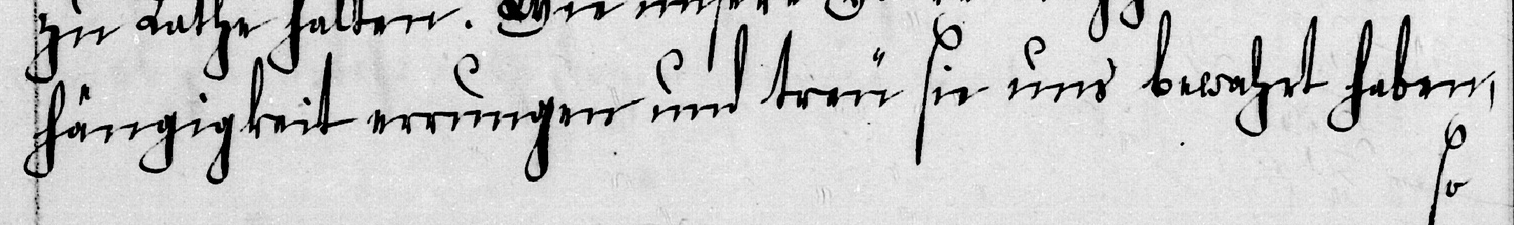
hängigkeit errungen und treu sie uns bewahrt haben
